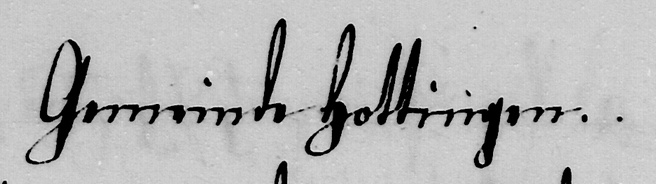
Gemeinde Hottingen.
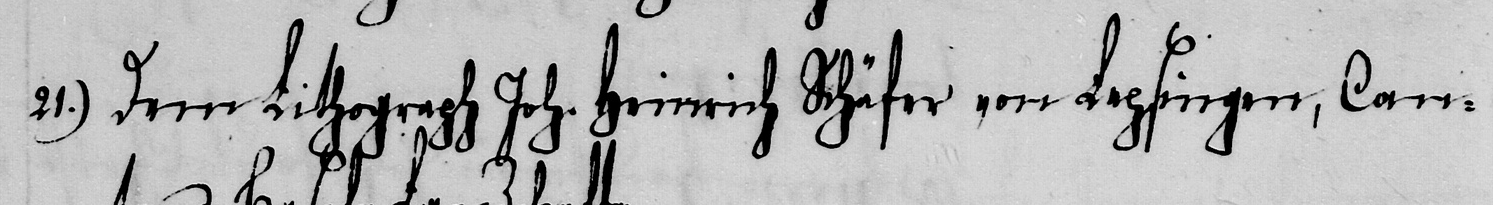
21.) Dem Lithograph Joh. Heinrich Schäfer von Lepsingen, Can¬
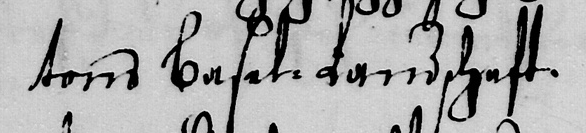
tons Basel Landschaft.
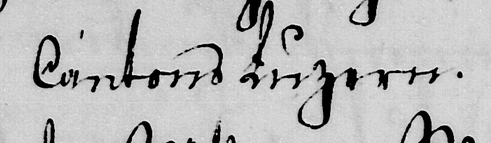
Cantons Luzern.
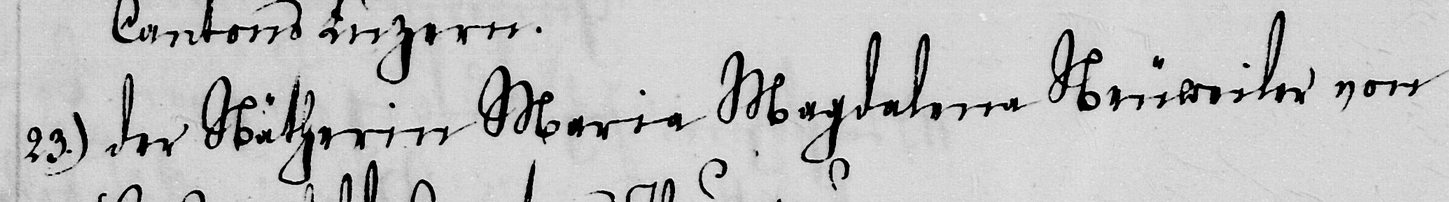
23.) der Nätherin Maria Magdalena Neuweiler von
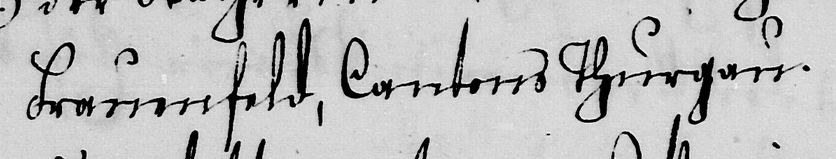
Frauenfeld, Cantons Thurgau.
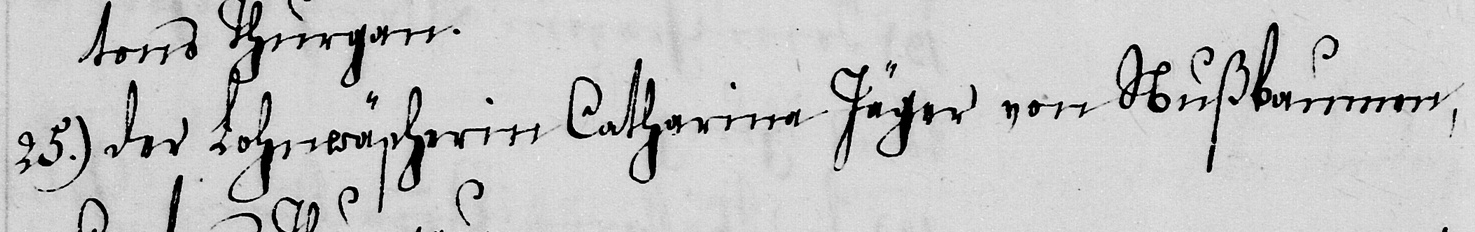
25.) der Lonwäscherin Catharina Jäger von Nußbaumen,
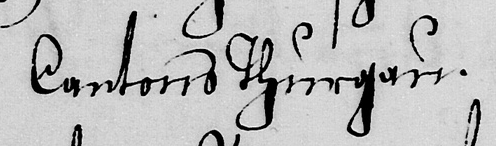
Cantons Thurgau.
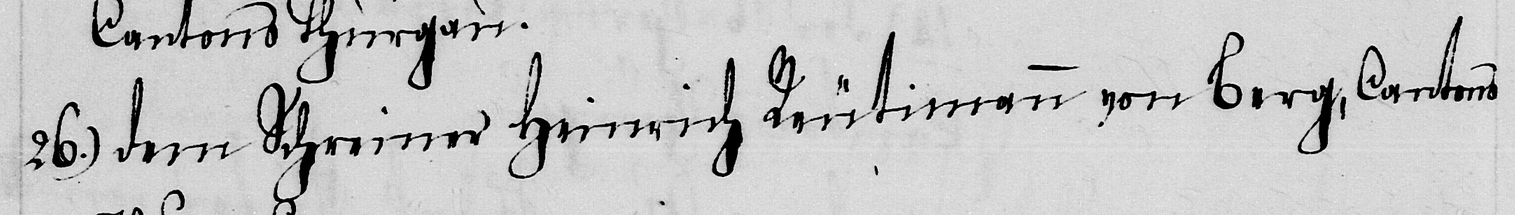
26.) dem Schreiner Heinrich Reutimann von Berg, Cantons
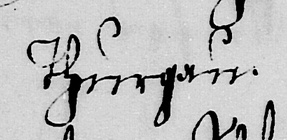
Thurgau.
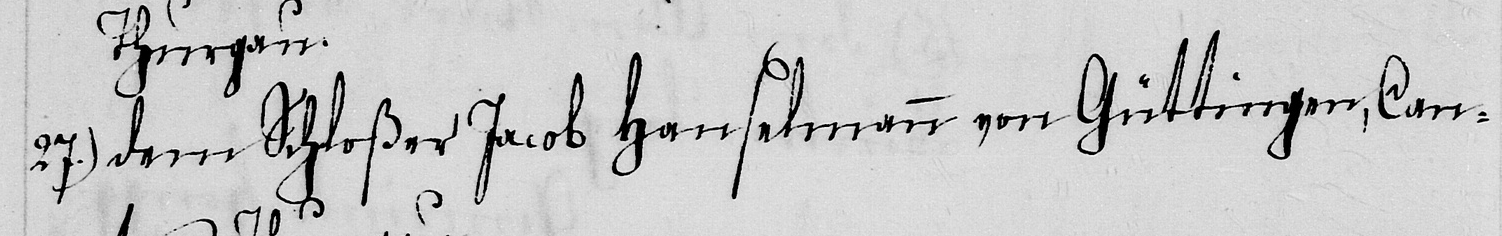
27.) dem Schloßer Jacob Hauselmann von Güttingen, Can¬
